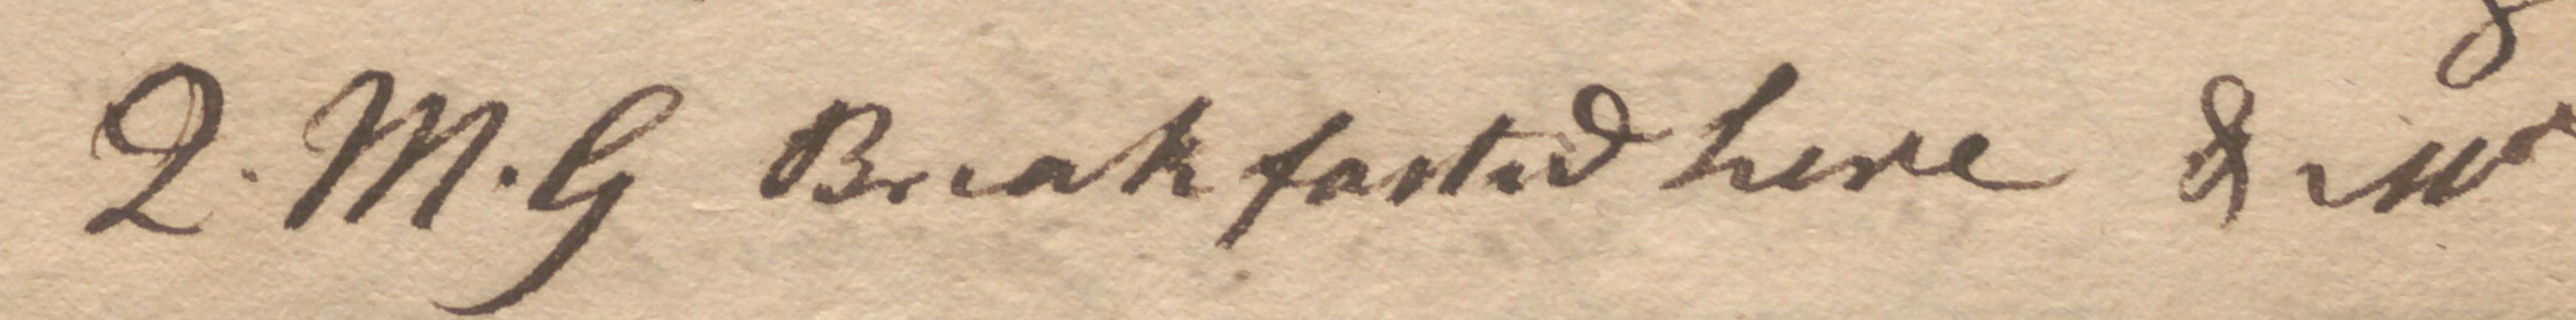Q.M.G Breakfasted here & M^r
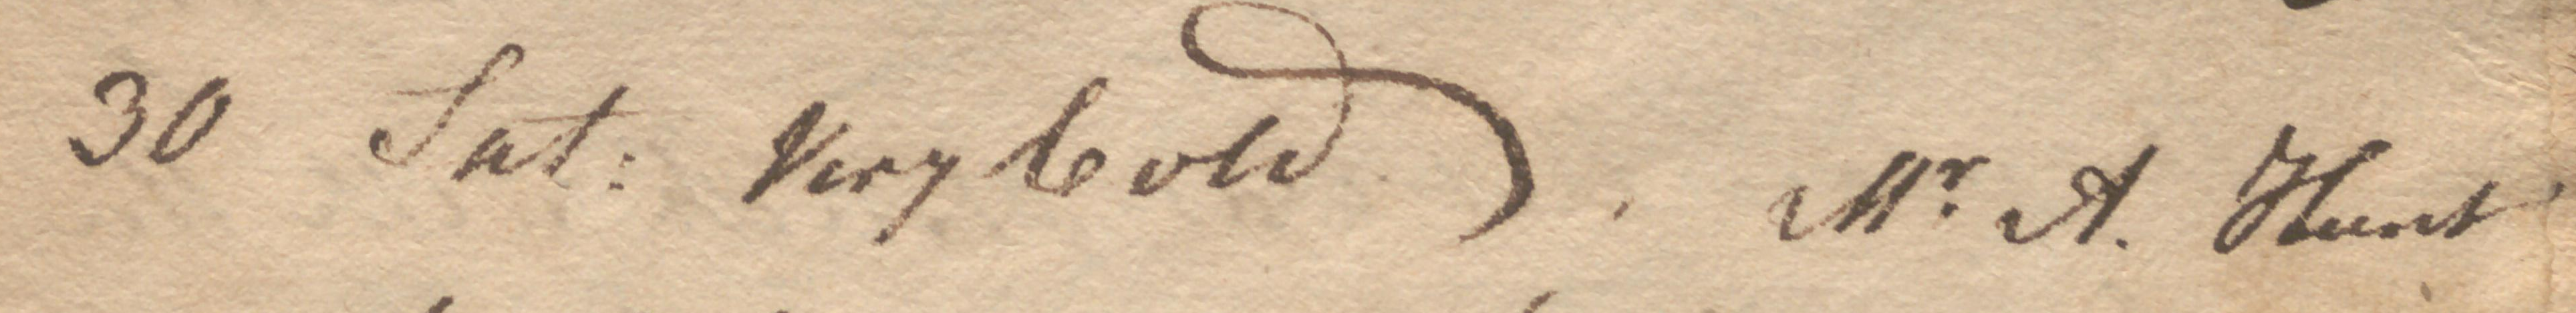30 Sat. Very Cold. M^r. A. Hunt
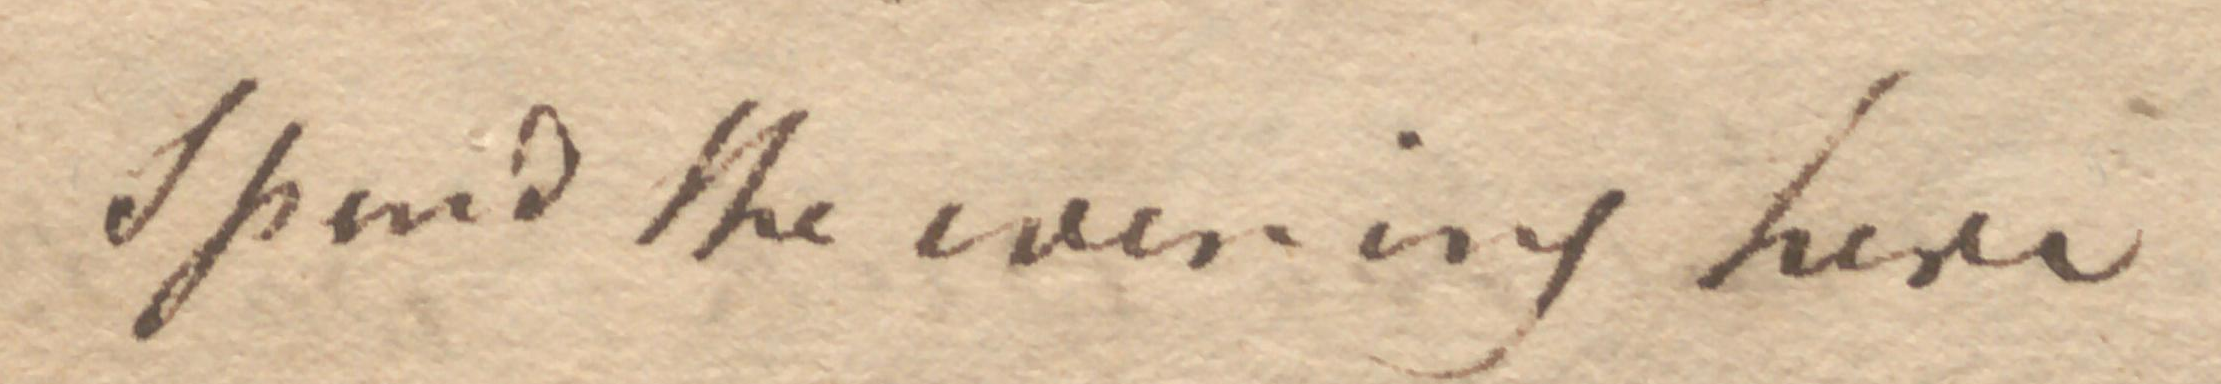spend the evening here
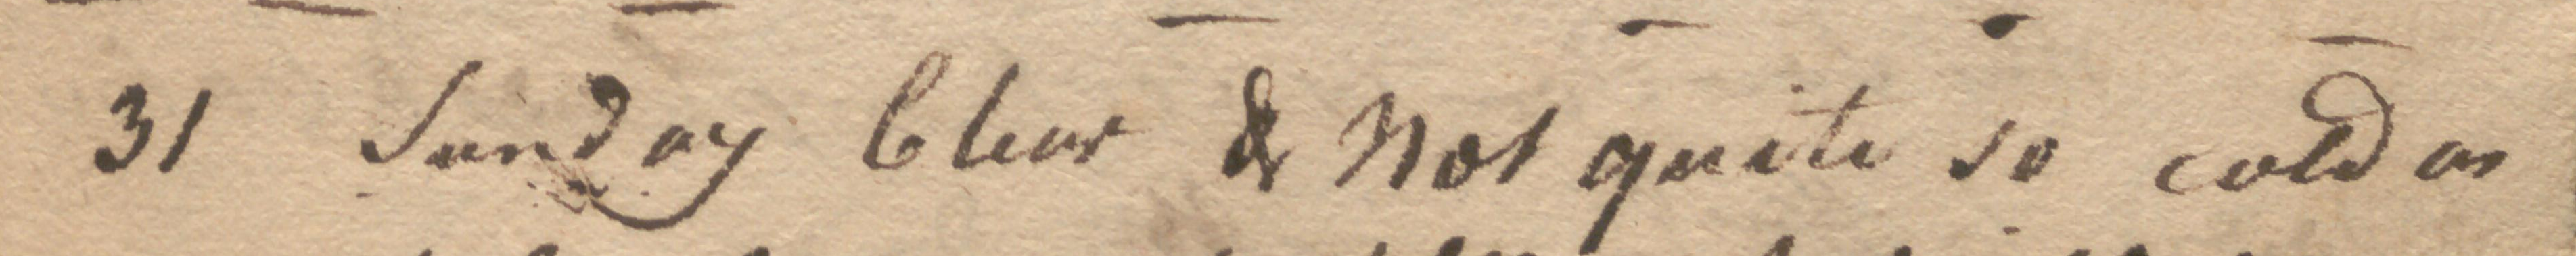31 Sunday Clear & Not quite so cold as
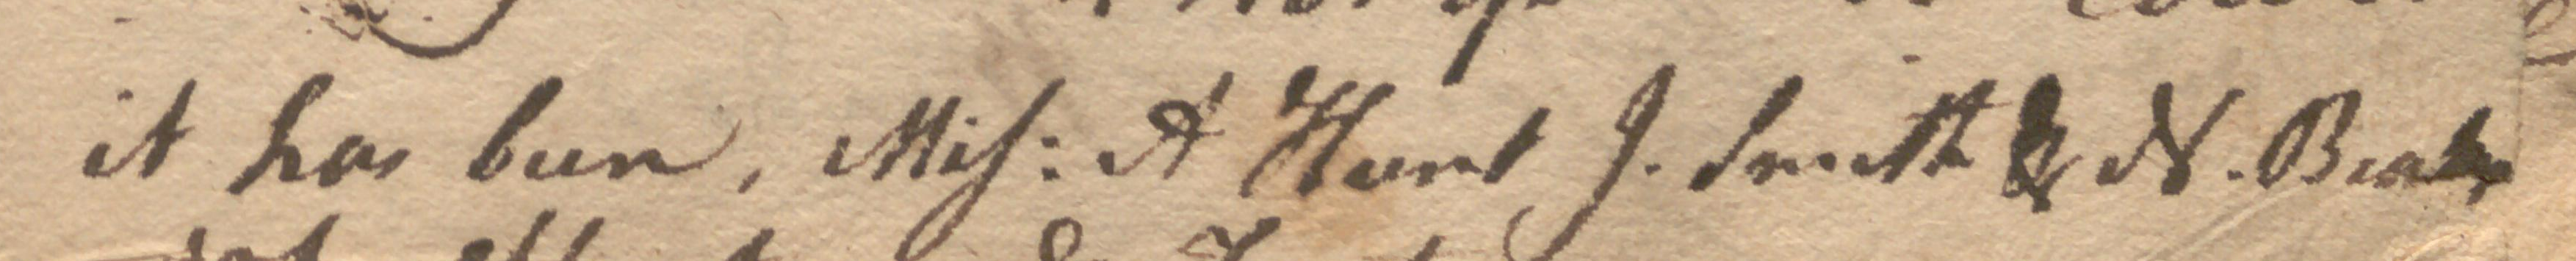it has been, Mis: A Hunt J. Smith & N. Beals
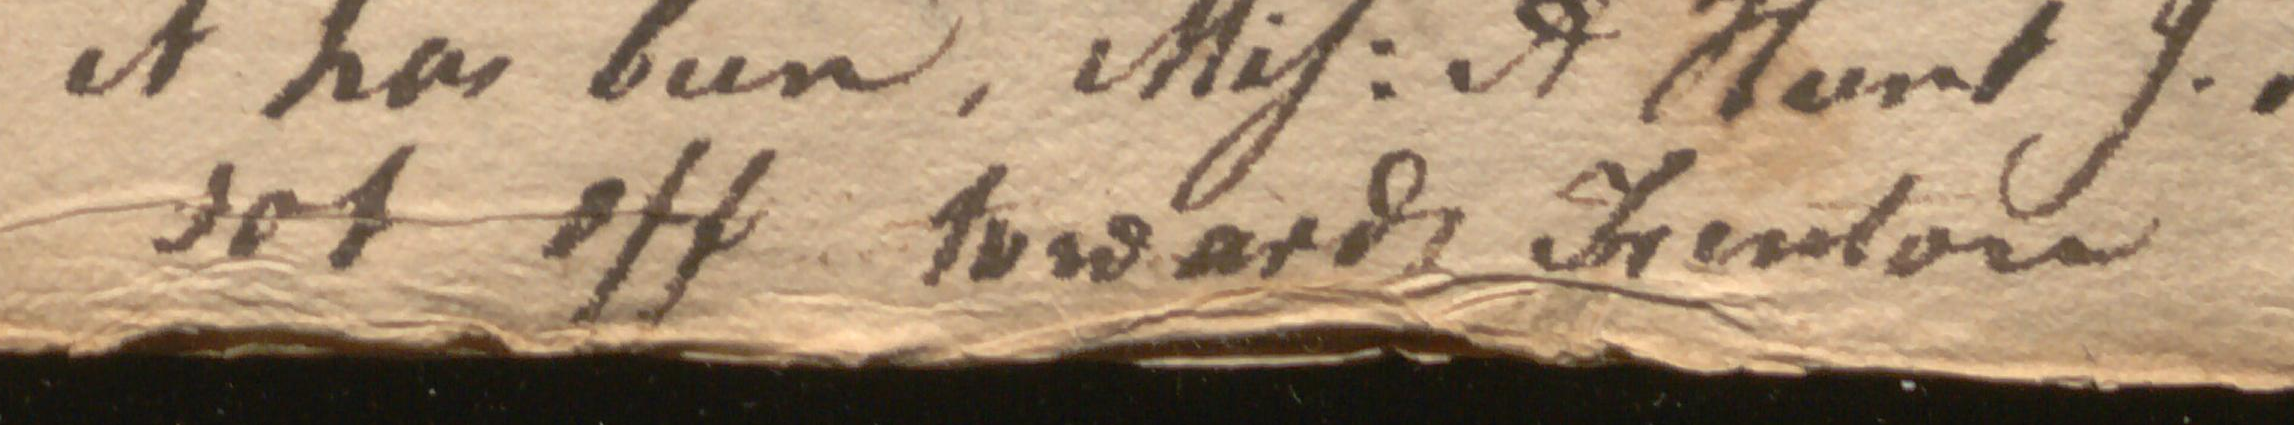set off toward Trenton
